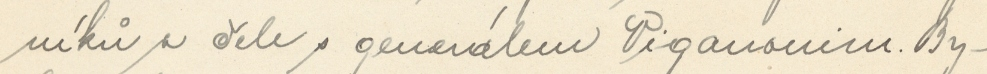níků v čele s generálem Viganonim. By-
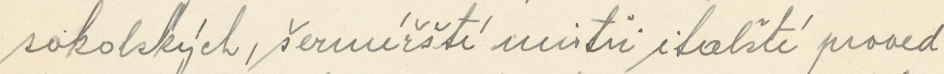sokolských, šermířští mistři italští proved-
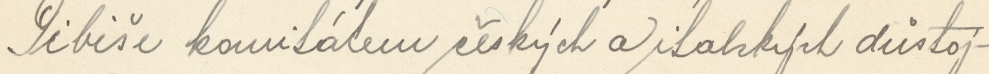Pibiše komitátem českých a italských důstoj-
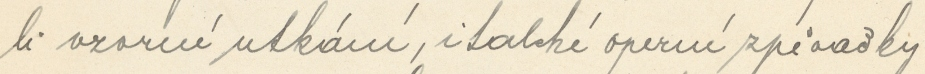li vzorné utkání, italské operní zpěvačky
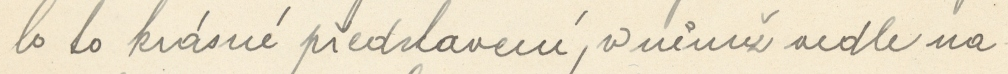lo to krásné představení, v němž vedle na-
